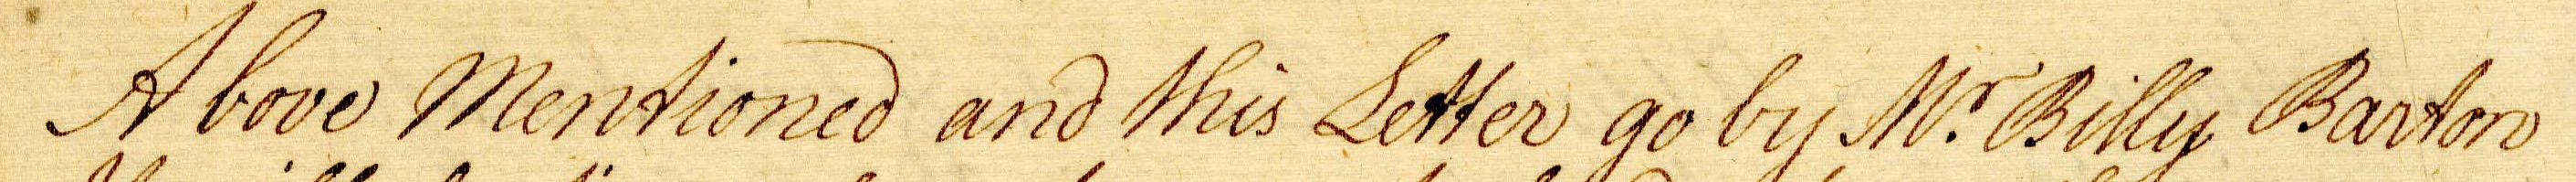Above Mentioned and this Letter go by M^r. Billy Barton
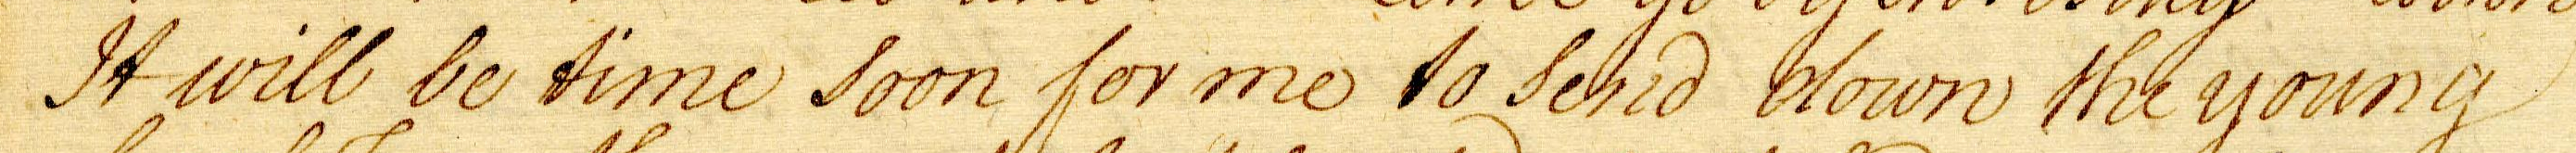It will be time Soon for me to Send down the young
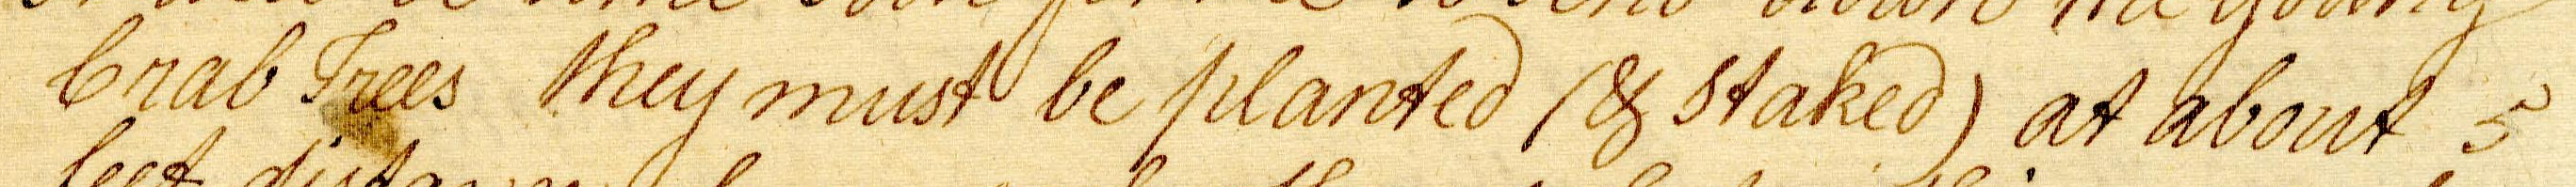Crab Trees they must be planted (& staked) at about 5
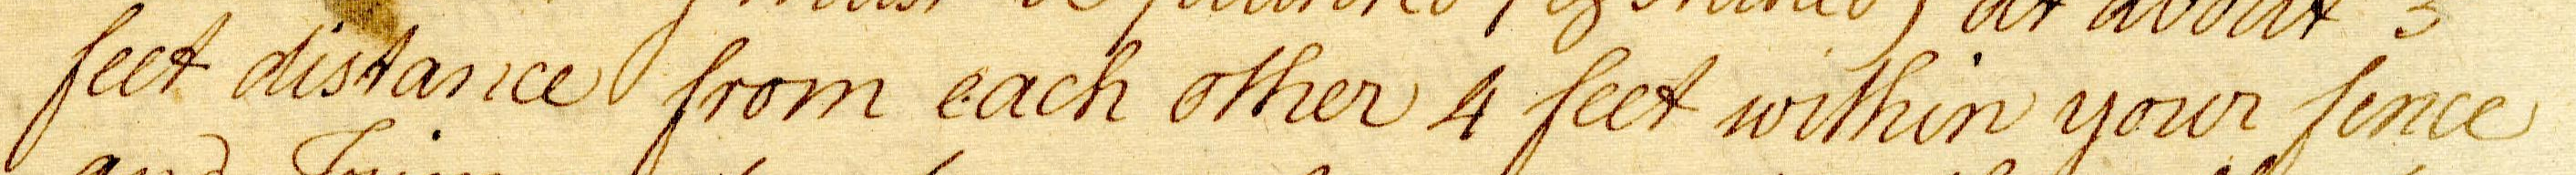feet distance from each other 4 feet within your fence
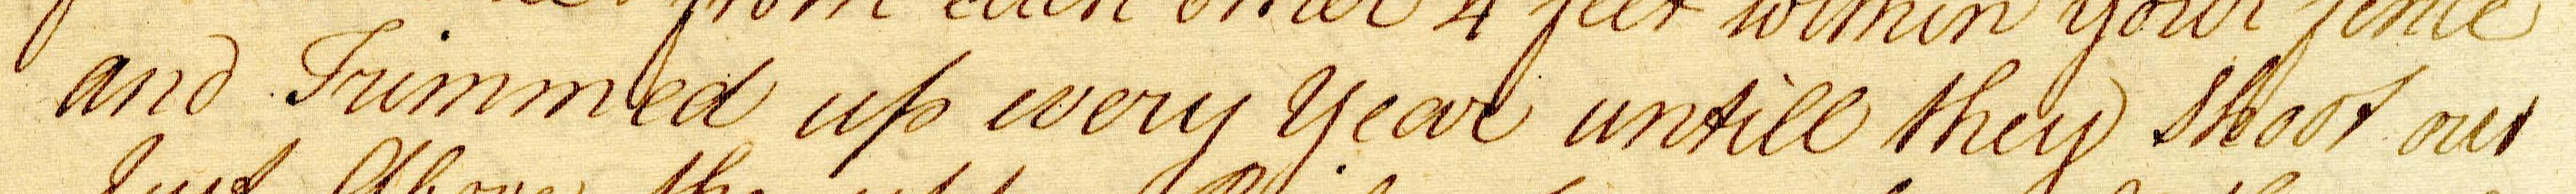and Trimmed up every Year untill they Shoot out
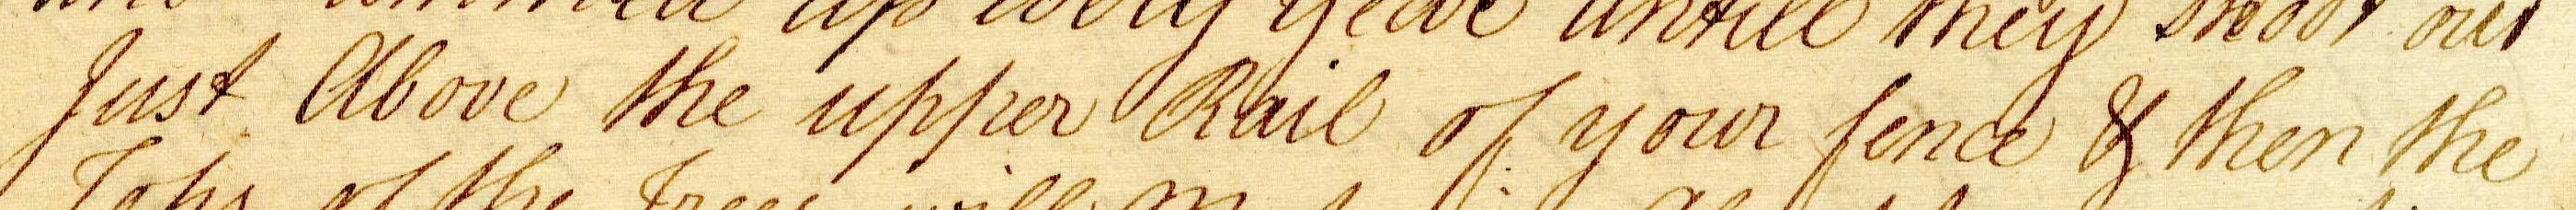Just Above the upper Rail of your fence & then the
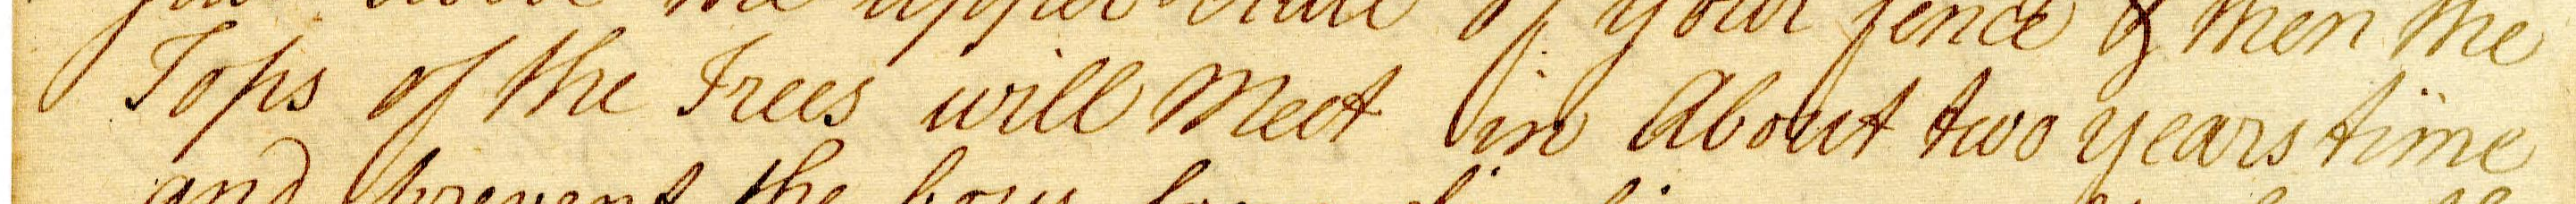Tops of the Trees will Meet in about two years time
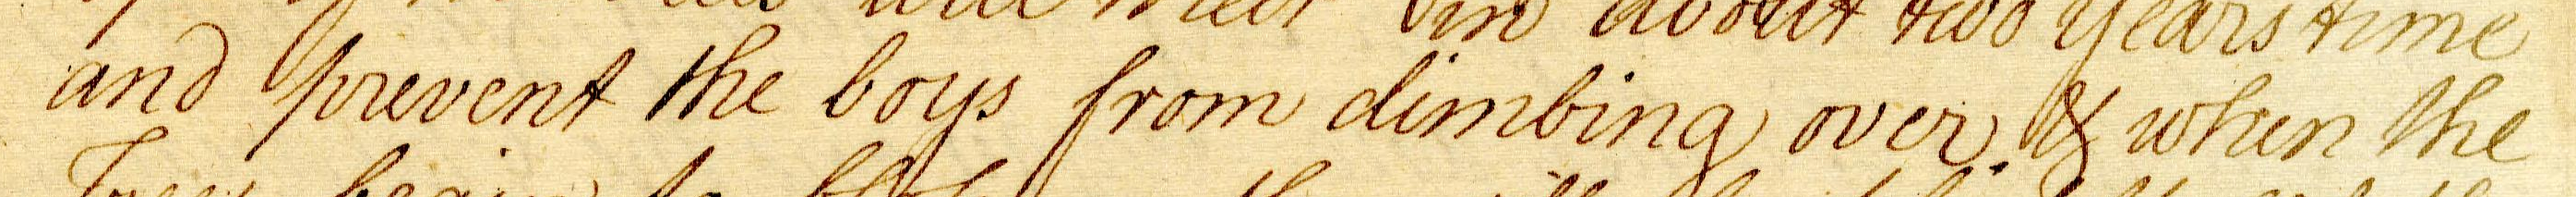and prevent the boys from climbing over. & when the
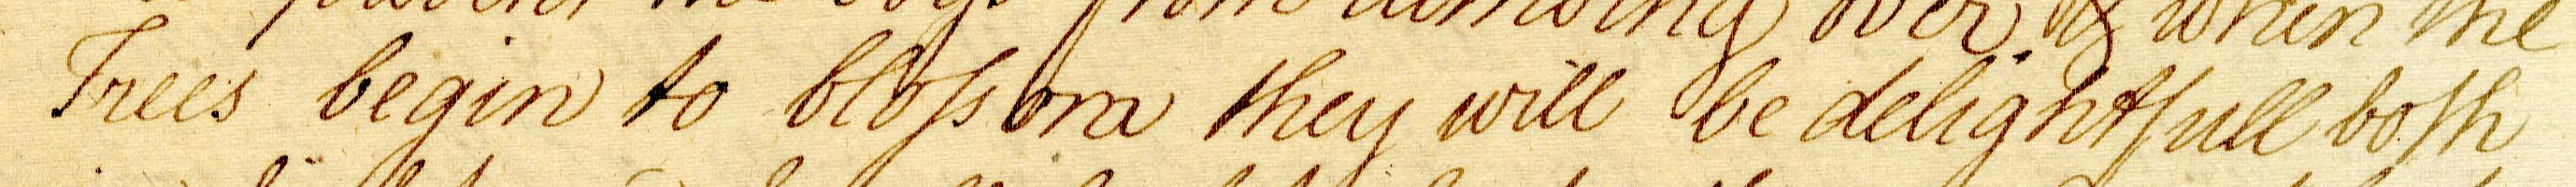Trees begin to blossom they will be delightfull both
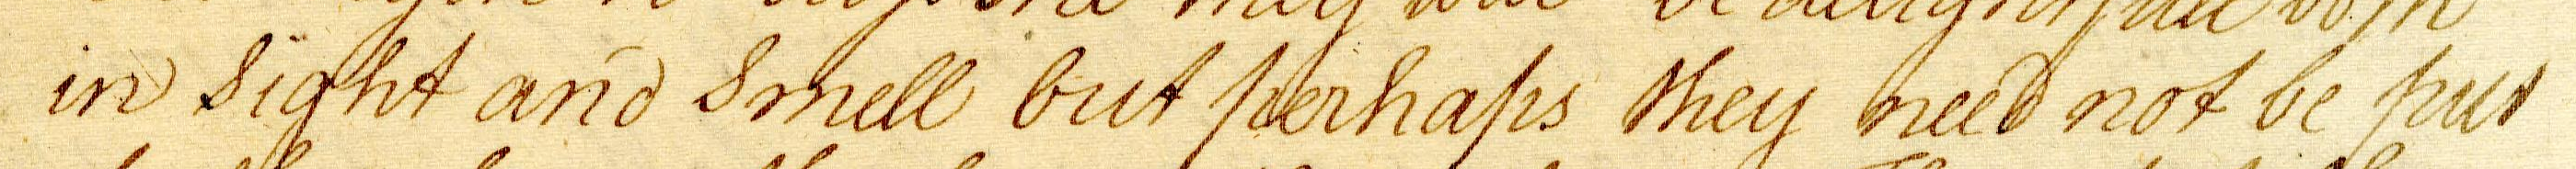in Sight and Smell but perhaps they need not be put
